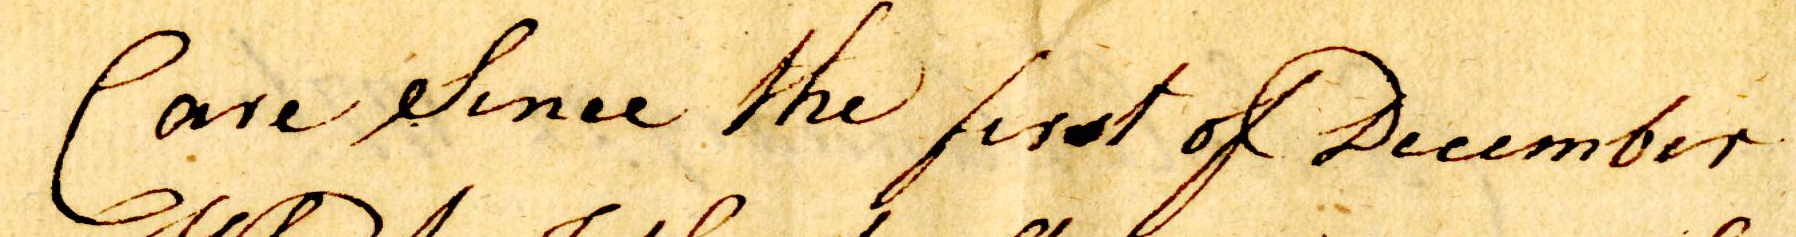Care since the first of December
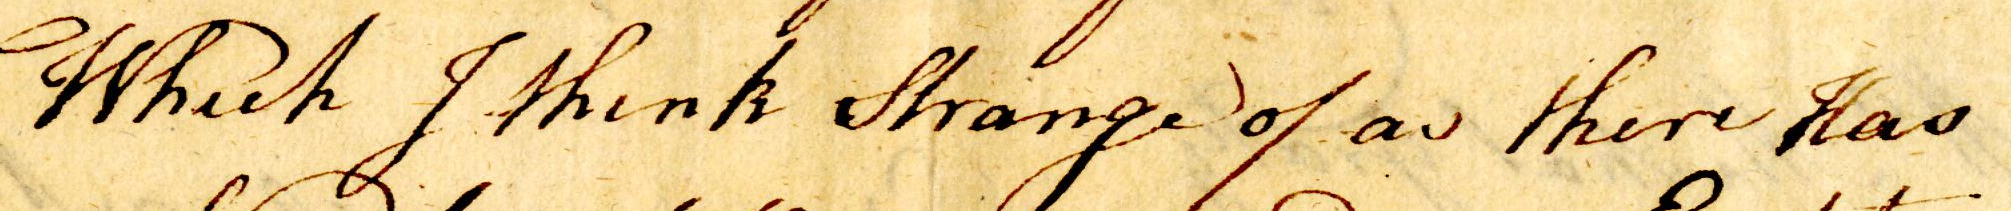Which I think strange of as there has
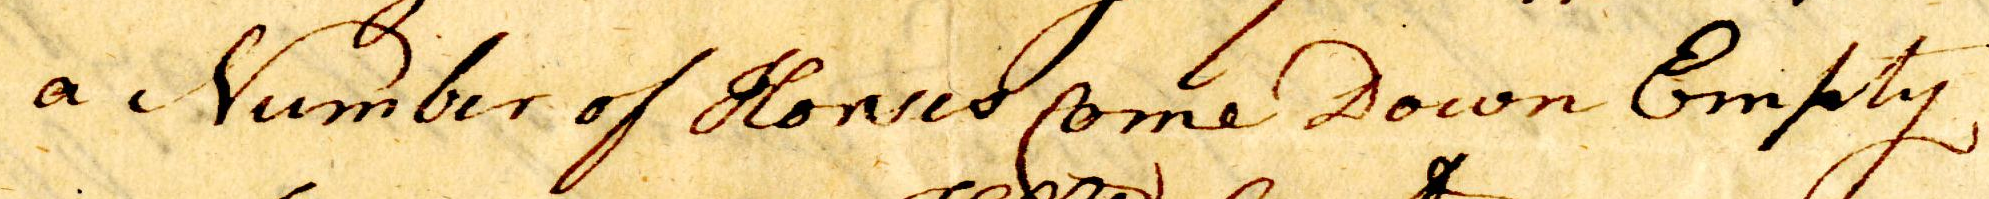a Number of hands come down Empty
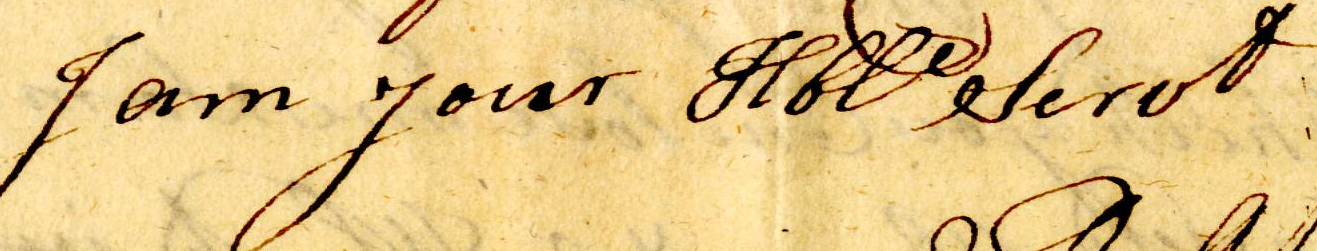I am your Hbl^e Serv^t
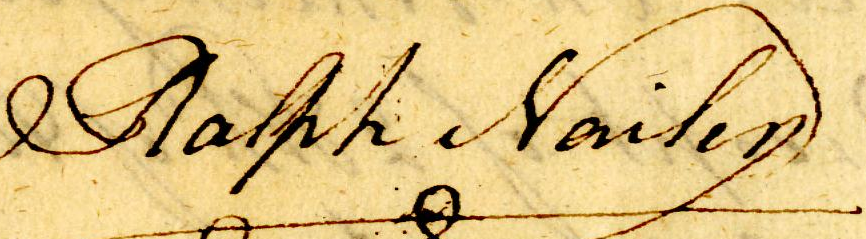Ralph Nailer
